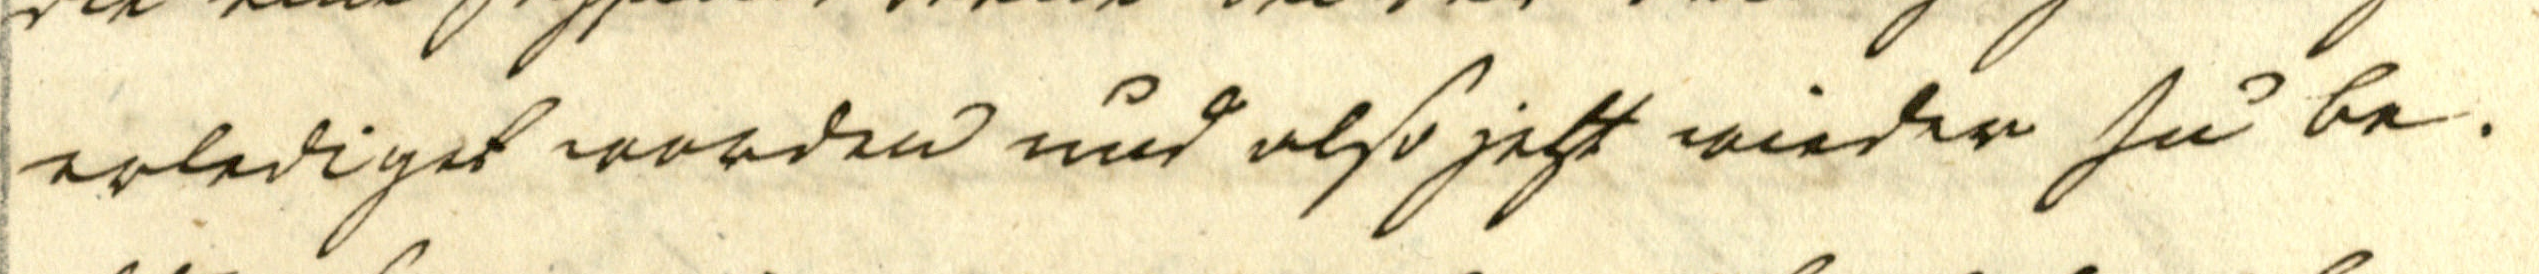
erlediget worden und also jetzt wieder zu be¬
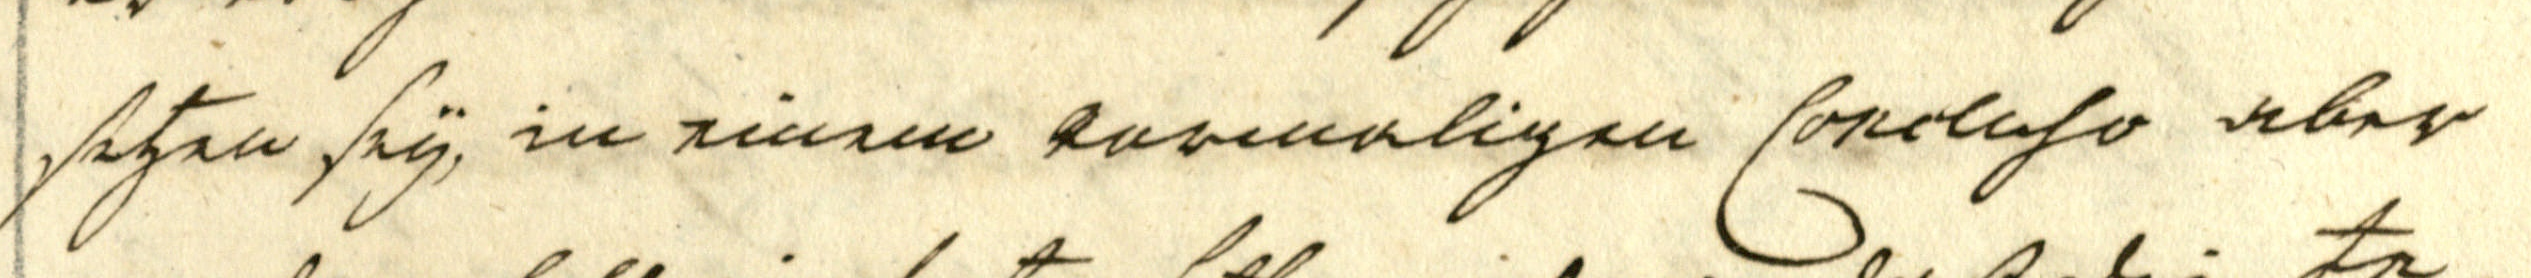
setzen seÿ, im einem vormaligen Concluso aber
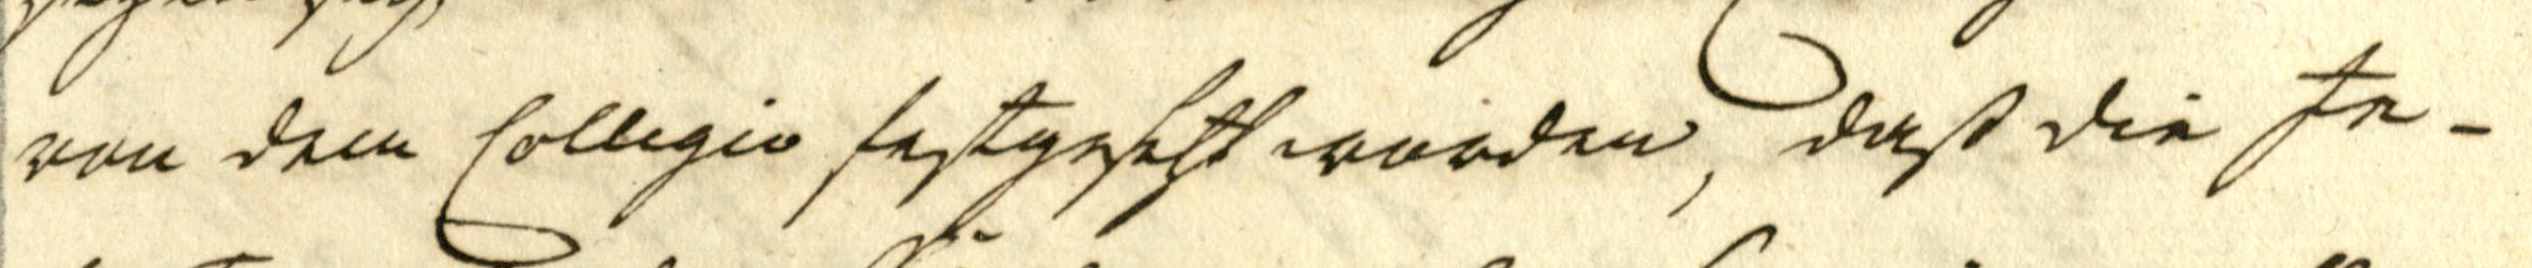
von dem Collegio festgesetzt worden daß die In¬
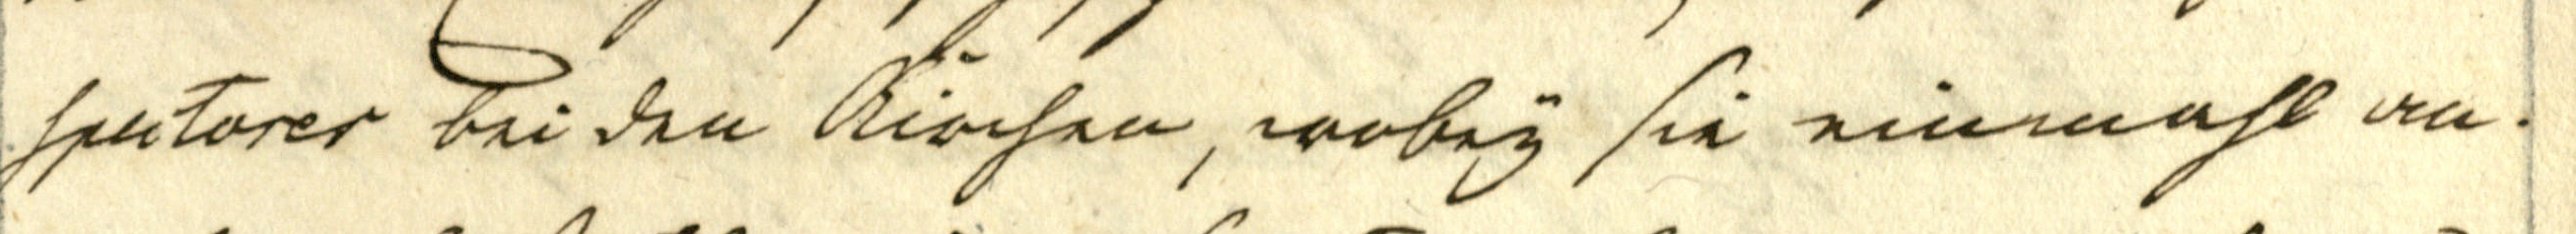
pectores bei den Kirchen, wobey sie einmahl an¬
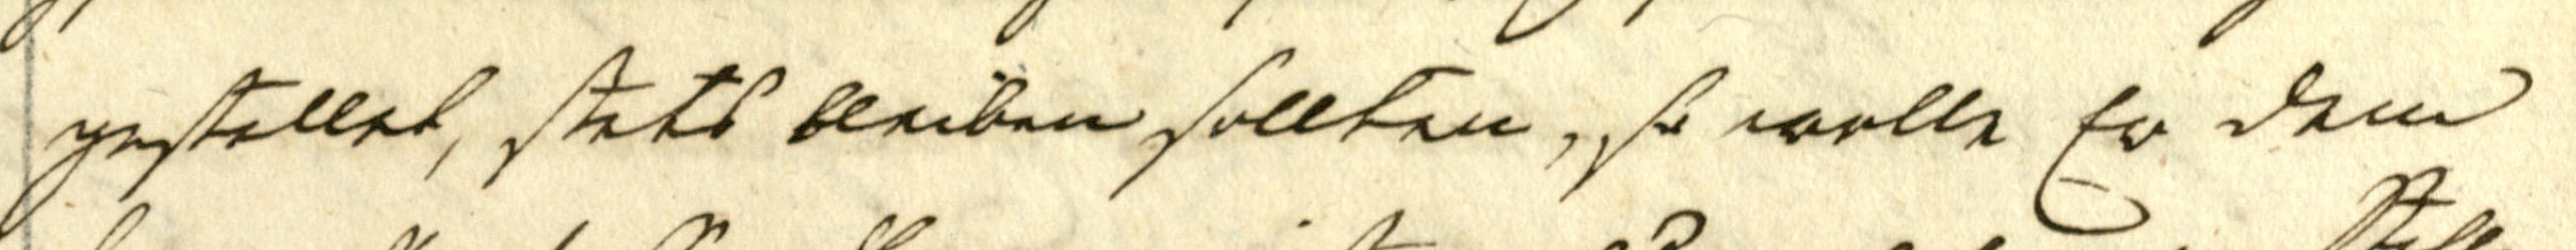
gestellet, stets bleiben sollten, so wolle Er dem
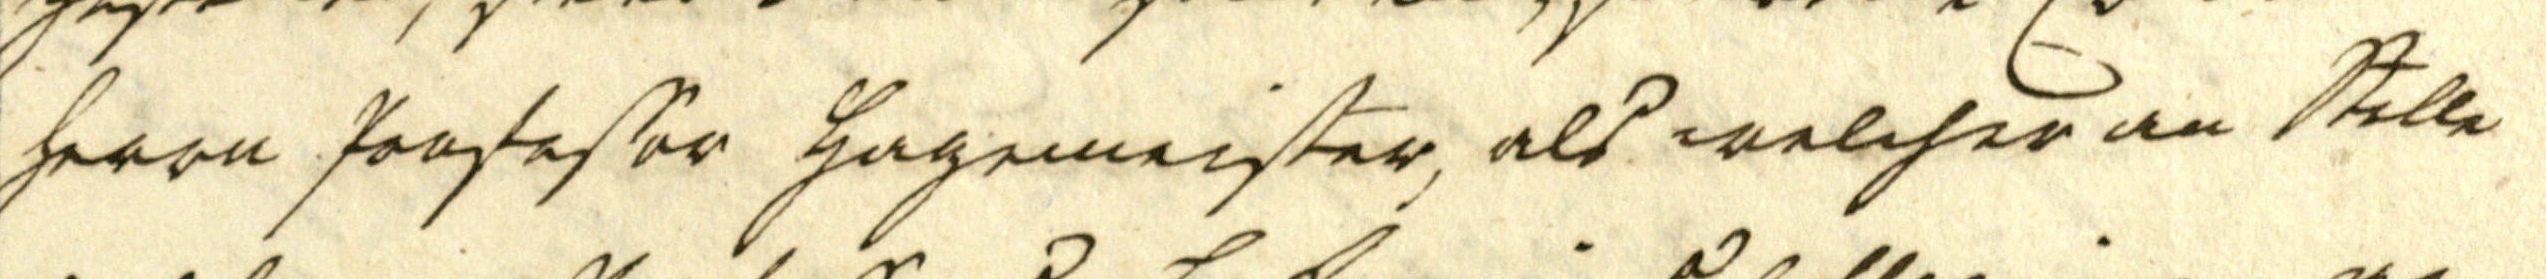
Herrn Professor Hagemeister als welcher an Stelle
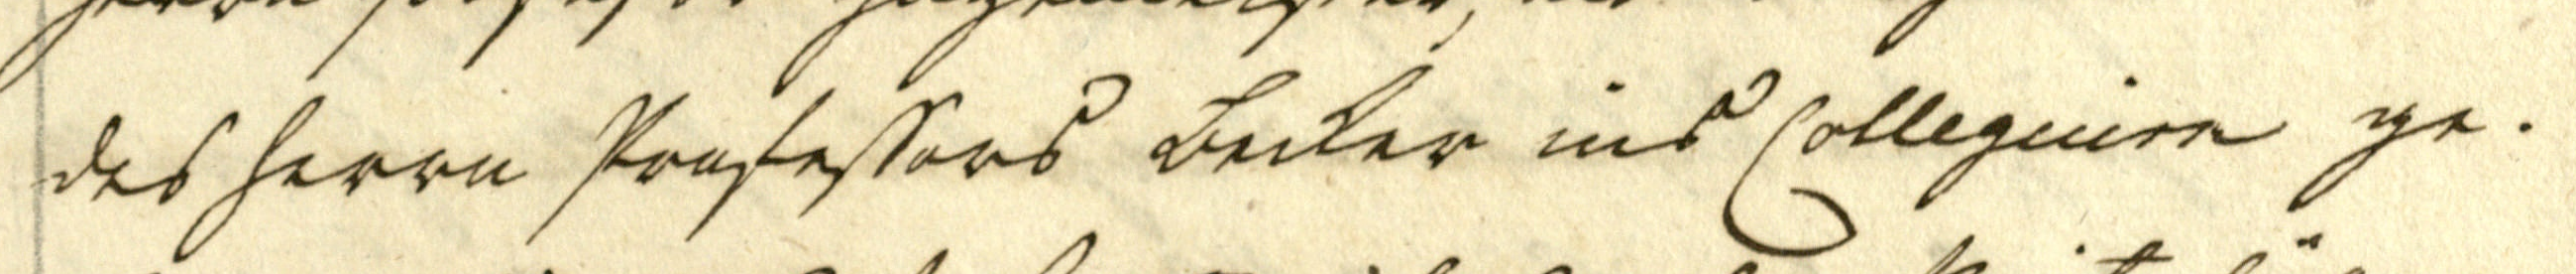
des Herrn Professors Becker ins Collegium ge¬
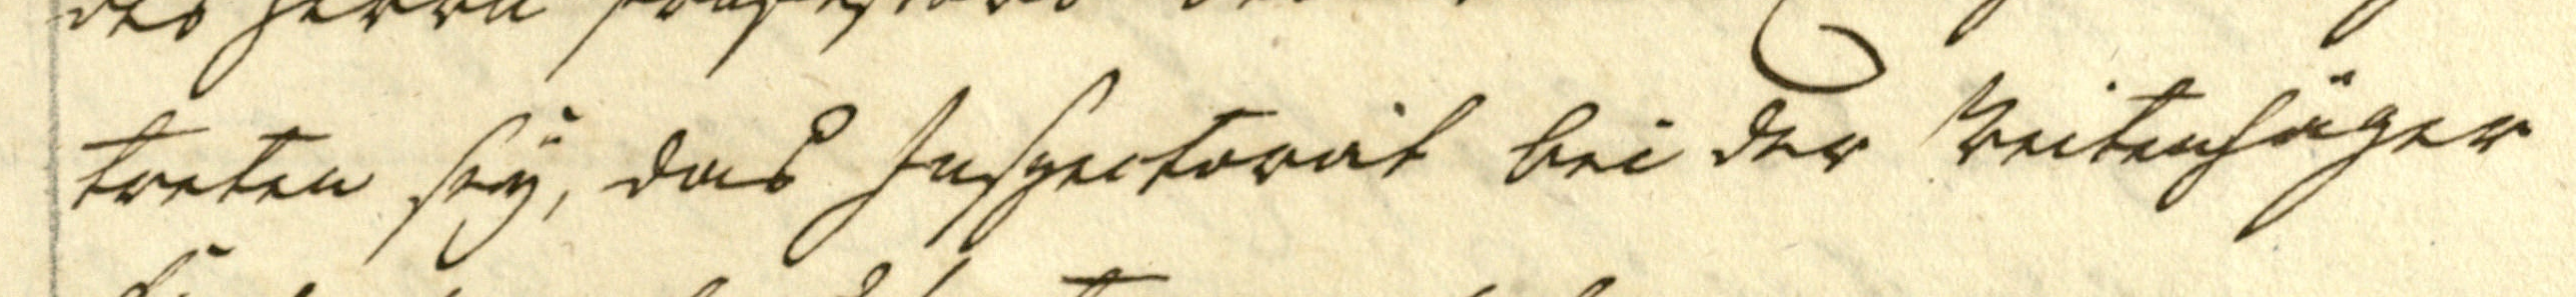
treten seÿ, das Inspectorat bei der Weitenhäger
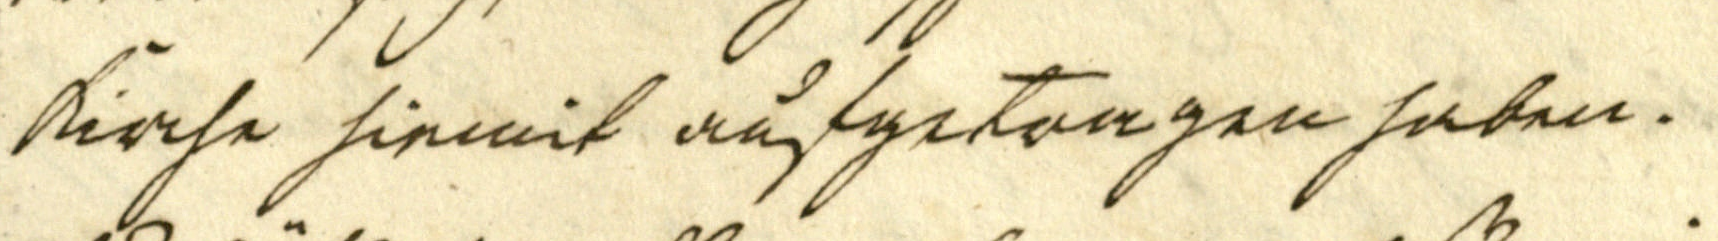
Kirche hiemit aufgetragen haben.
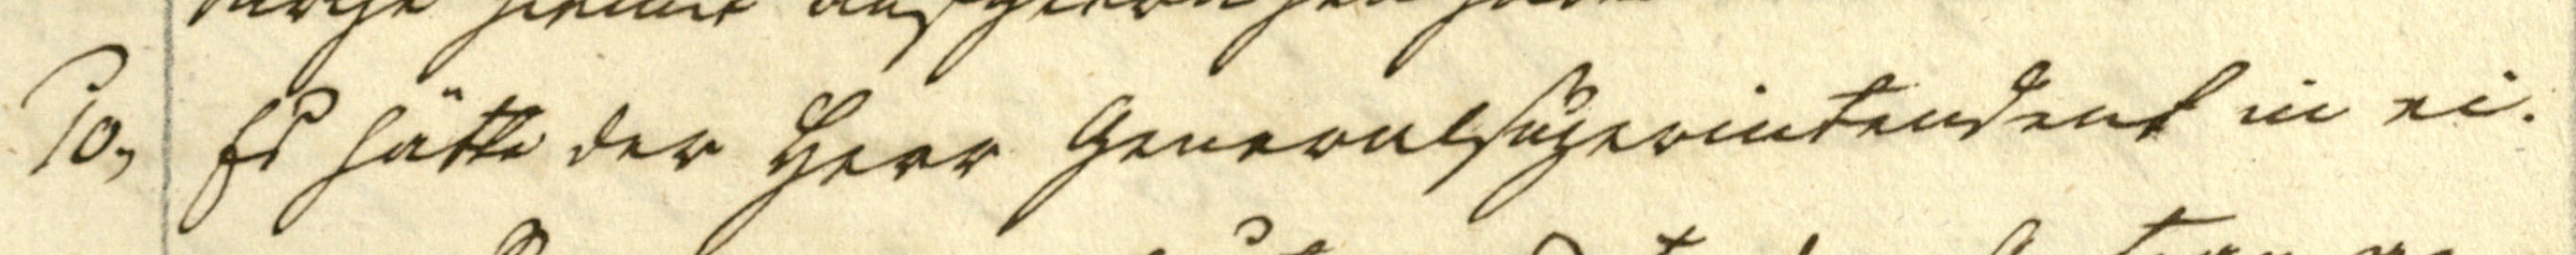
10. Es hätte der Herr Generalsuperintendent in ei¬
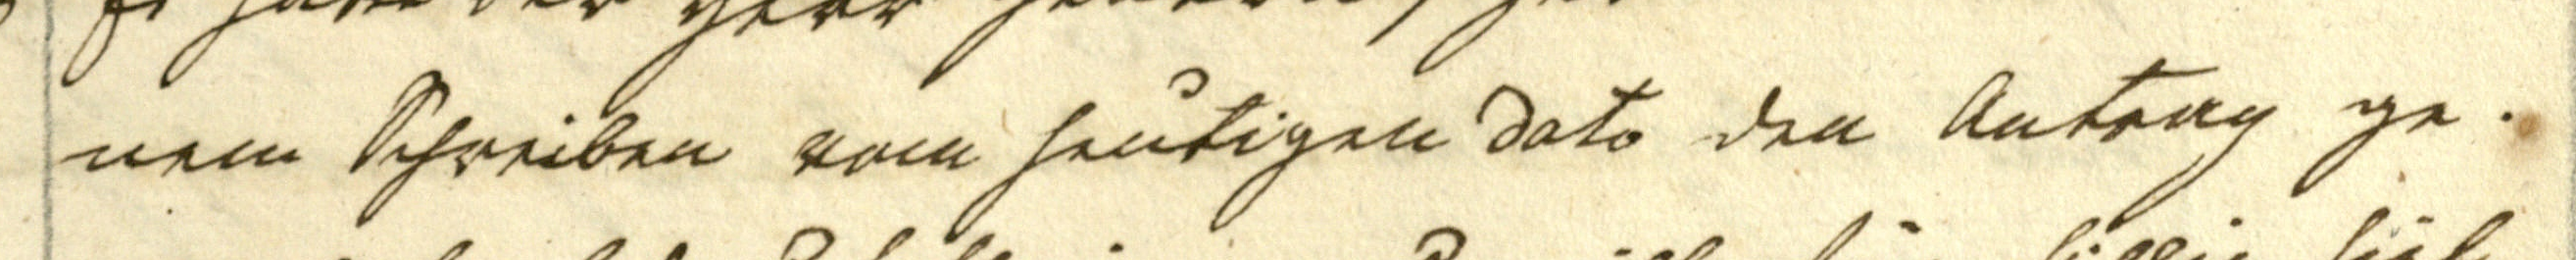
nem Schreiben vom heutigen dato den Antrag ge¬
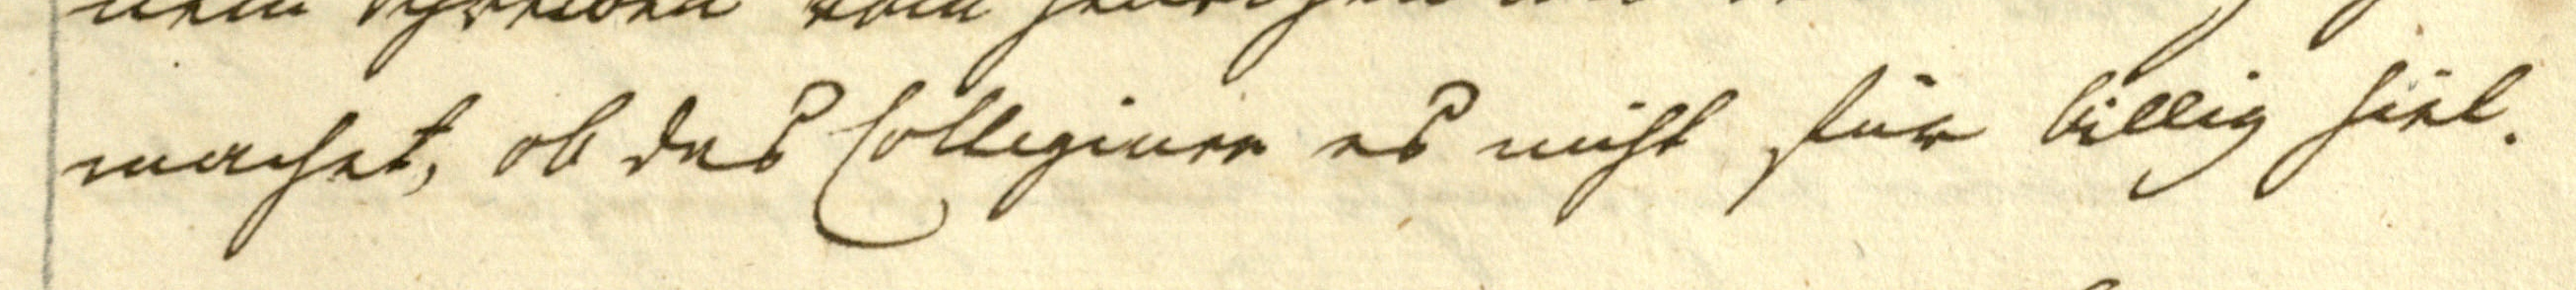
machet, ob das Collegium es nicht für billig hiel¬
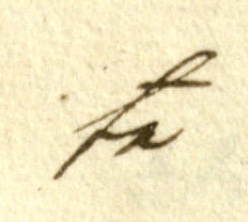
te
